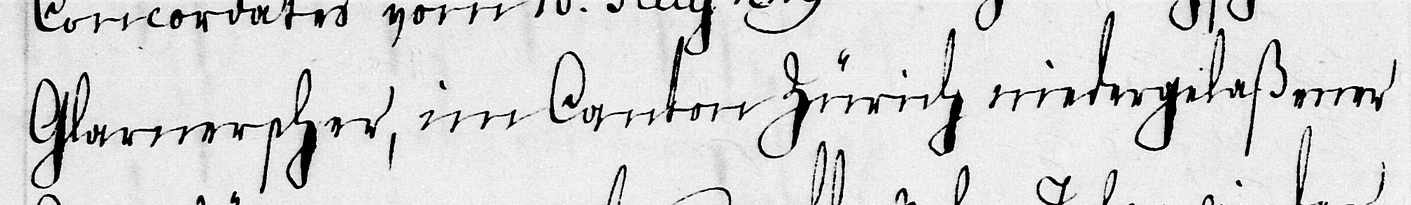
Glarnerscher, im Canton Zürich niedergelaßener
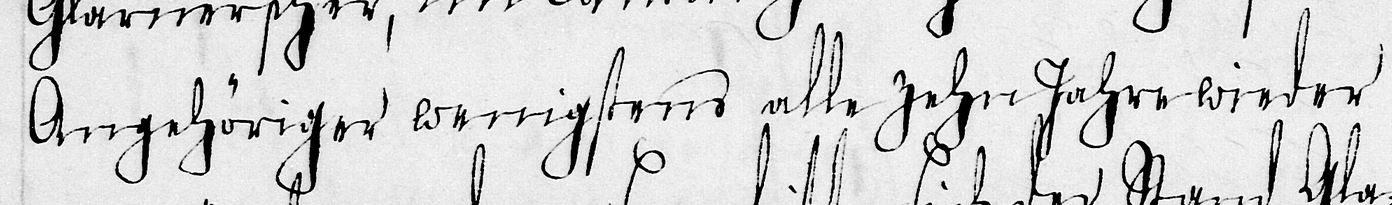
Angehöriger wenigstens alle zehn Jahre wieder
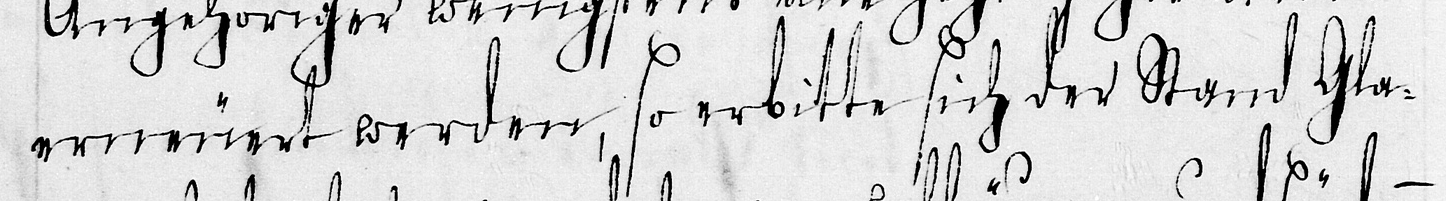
erneuert werden, so erbitte sich der Stand Gla¬
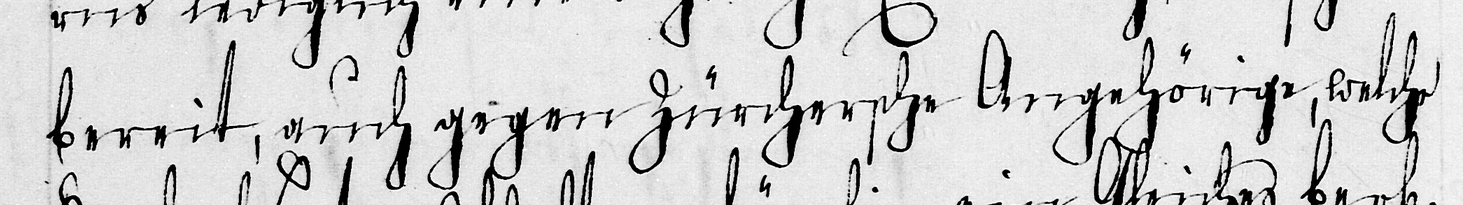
bereit, auch gegen Zürchersche Angehörige, welche
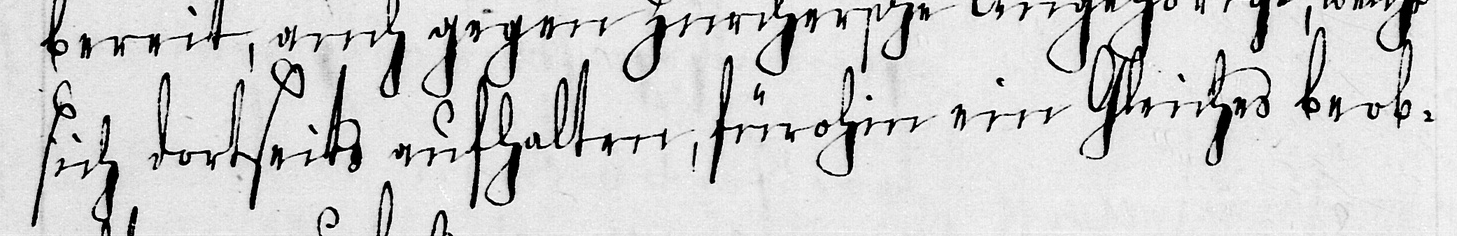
sich dortseits aufhalten, fürohin ein Gleiches beob¬
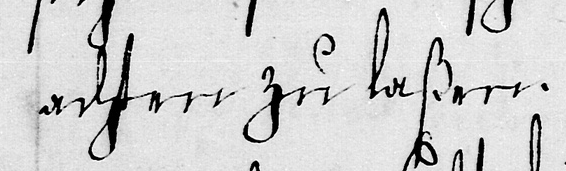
achten zu laßen.
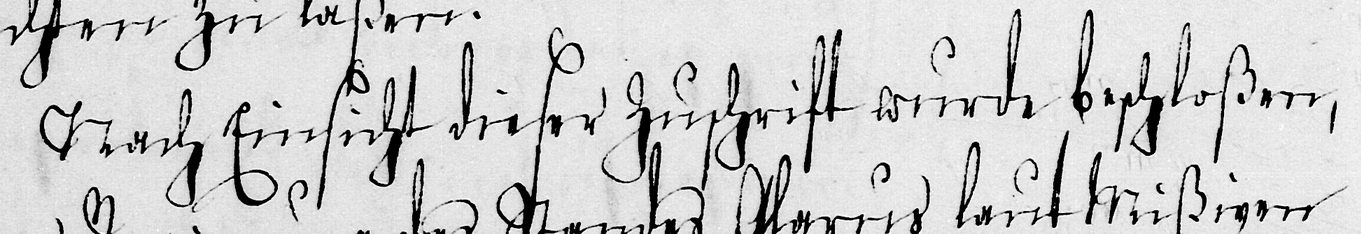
Nach Einsicht dieser Zuschrift wurde beschloßen,
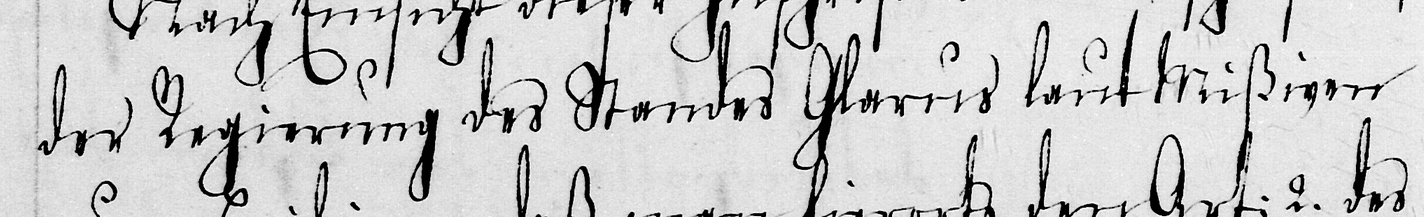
der Regierung des Standes Glarus laut Mißiven
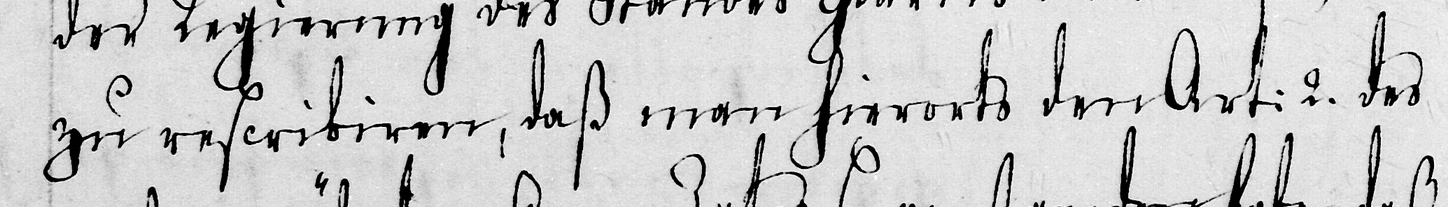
zu rescribiren, daß man hierorts den Art: 2. des
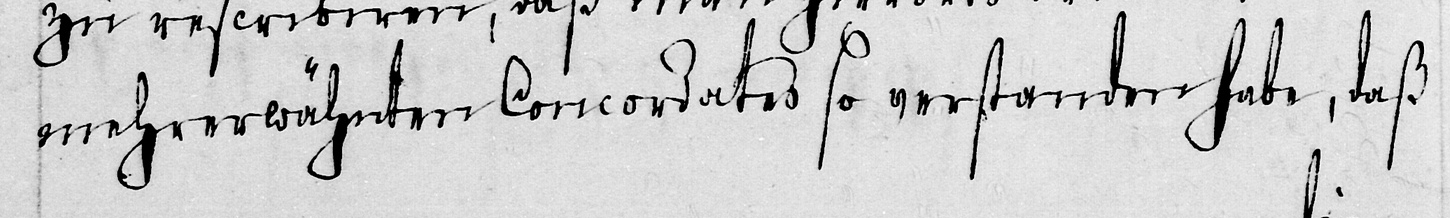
mehrerwähnten Concordates so verstanden habe, daß
